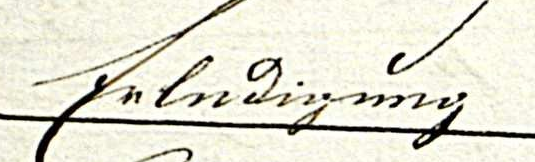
Erledigung
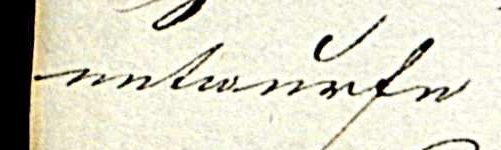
entwurfe
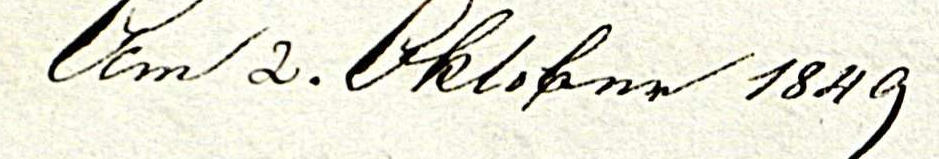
Am 2. Oktober 1849
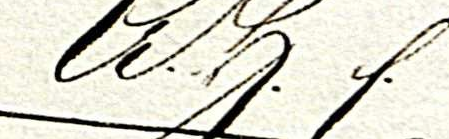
AH E
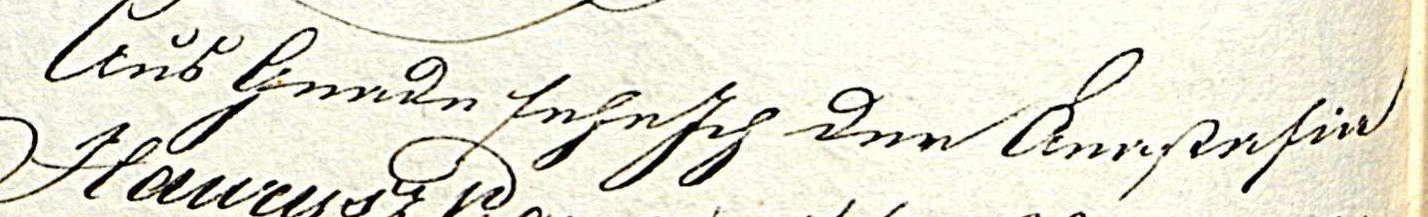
Aus Gnade sehe Ich der Anastasia
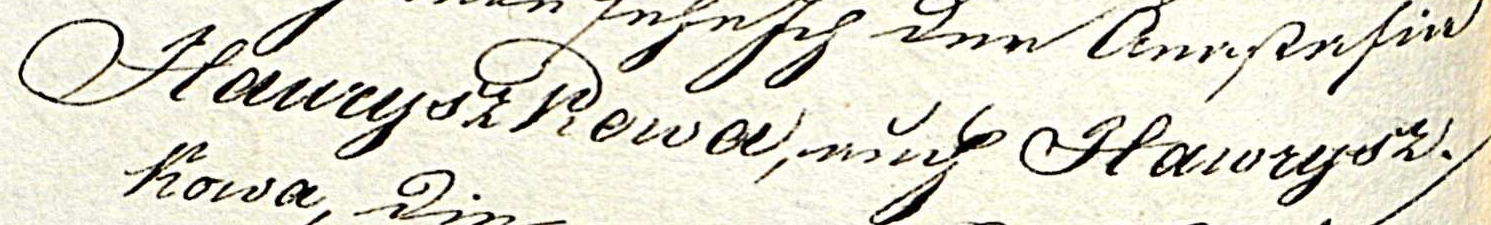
Hauryszkowa, auch Hawrysz¬
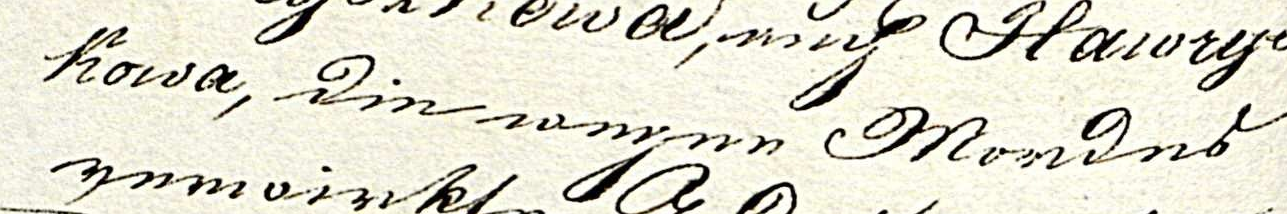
kowa, die wegen Mordes
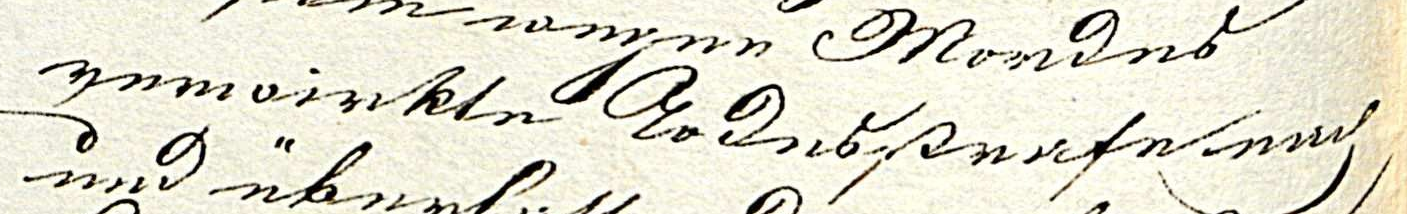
verwirkte Todesstrafe nach
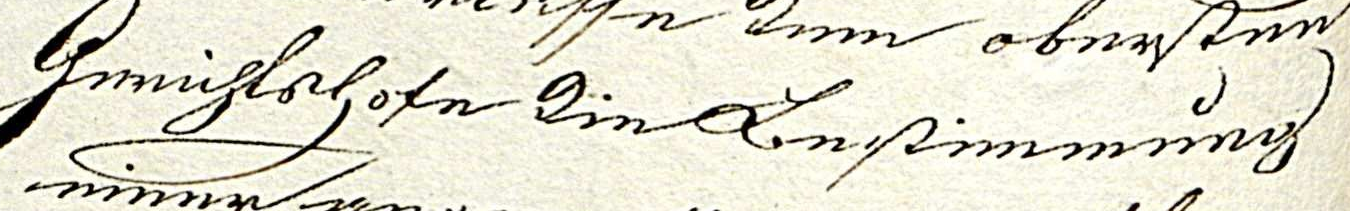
Gerichtshofe die Bestimmung
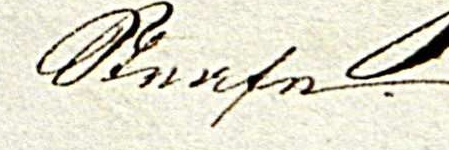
Strafe.
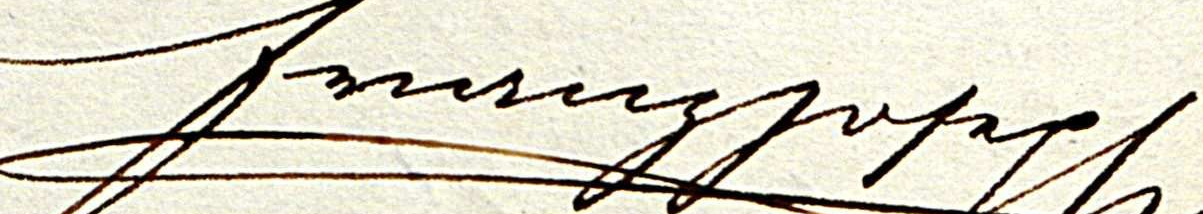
Franz Joseph
